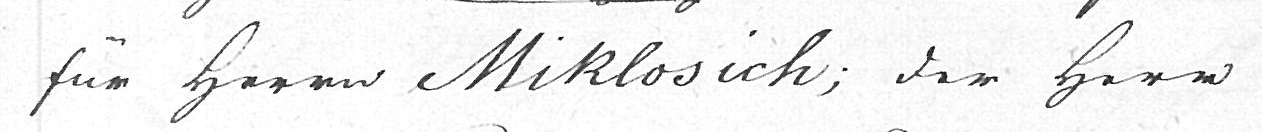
für Herrn Miklosich; der Herr
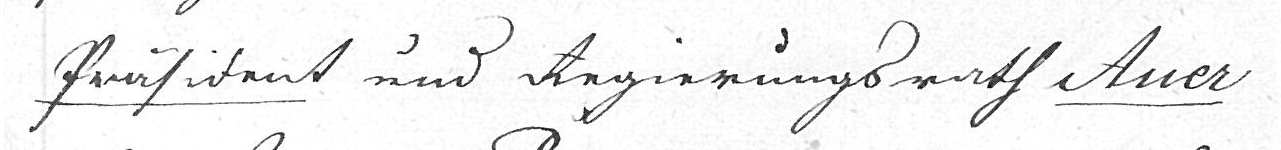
Präsident und Regierungsrath Auer
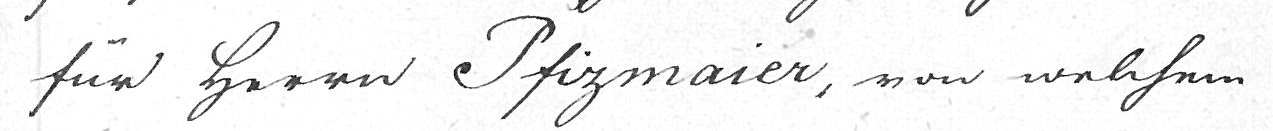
für Herrn Pfizmaier, von welchem
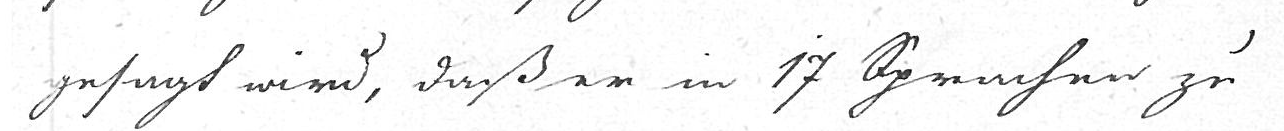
gesagt wird, daß er in 17 Sprachen zu
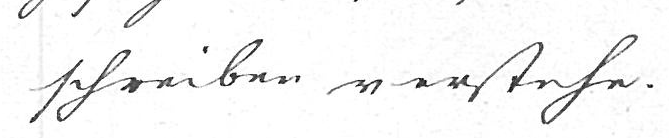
schreiben verstehe.
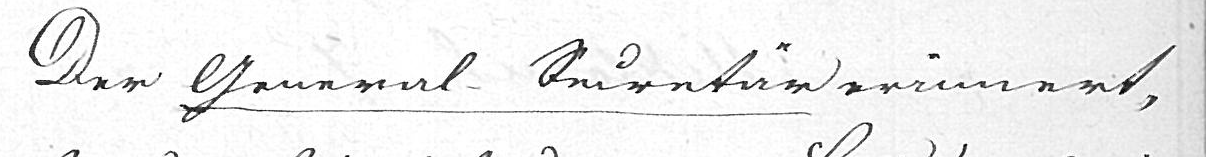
Der General-Secretär erinnert,
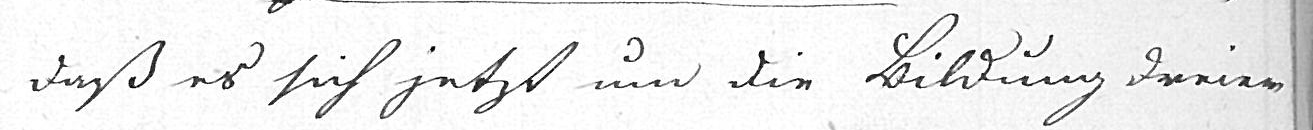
daß es sich jetzt um die Bildung dreier
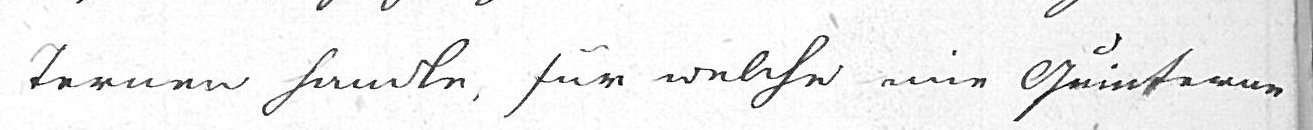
Ternen handle, für welche eine Quinterne
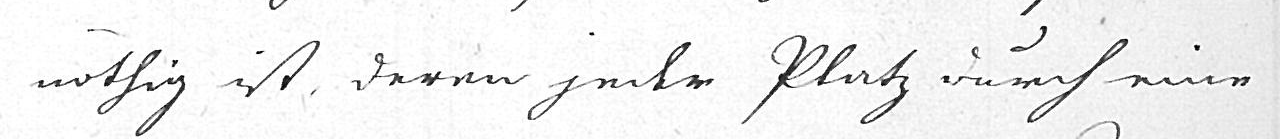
nöthig ist, deren jeder Platz durch eine
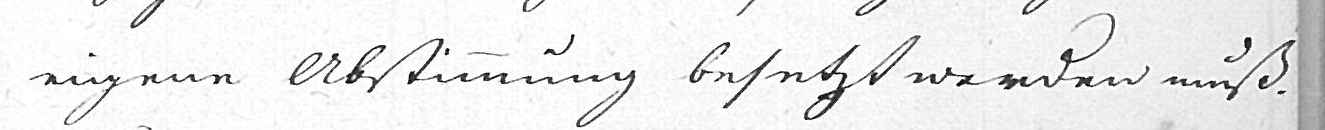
eigene Abstimmung besetzt werden muß.
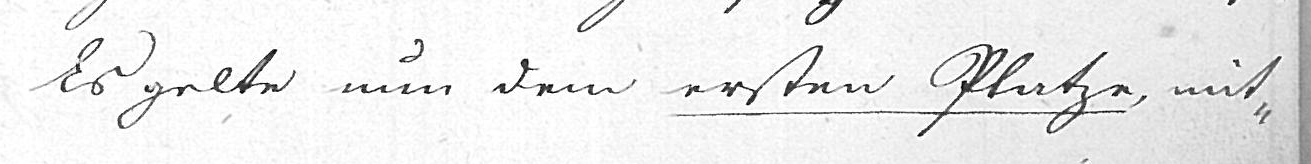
Es gelte nur dem ersten Platze mit-
